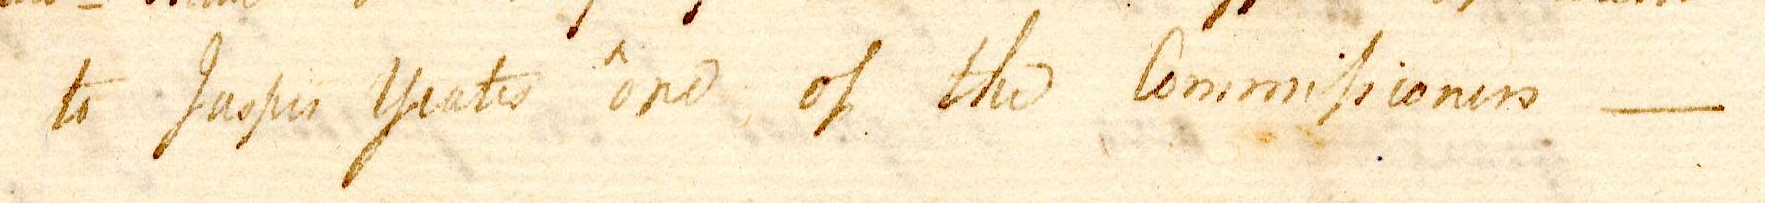to Jasper Yeates one of the Commissioners-
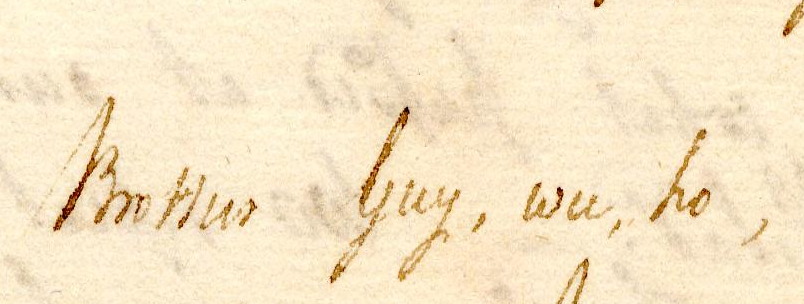Brother Guy, wee, ho,
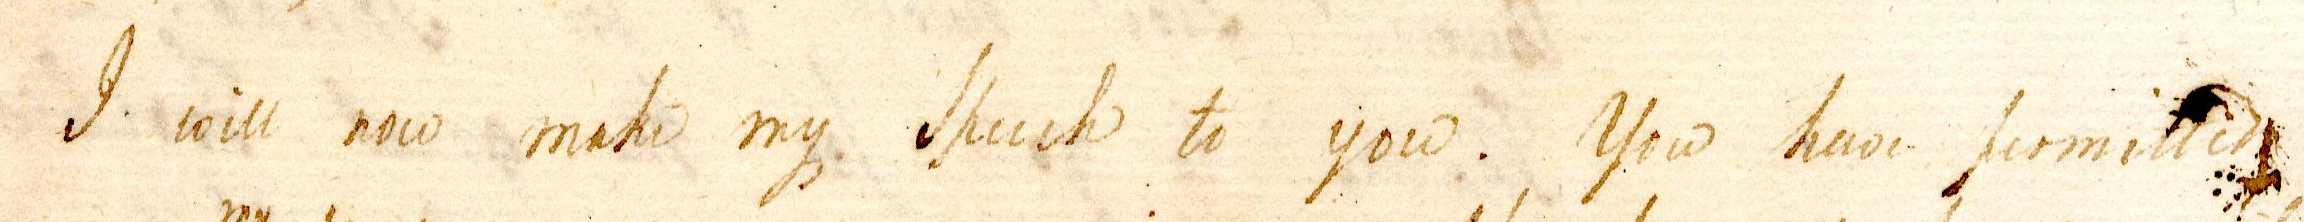I wil now make my Speech to you. You have permitted
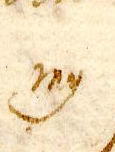my
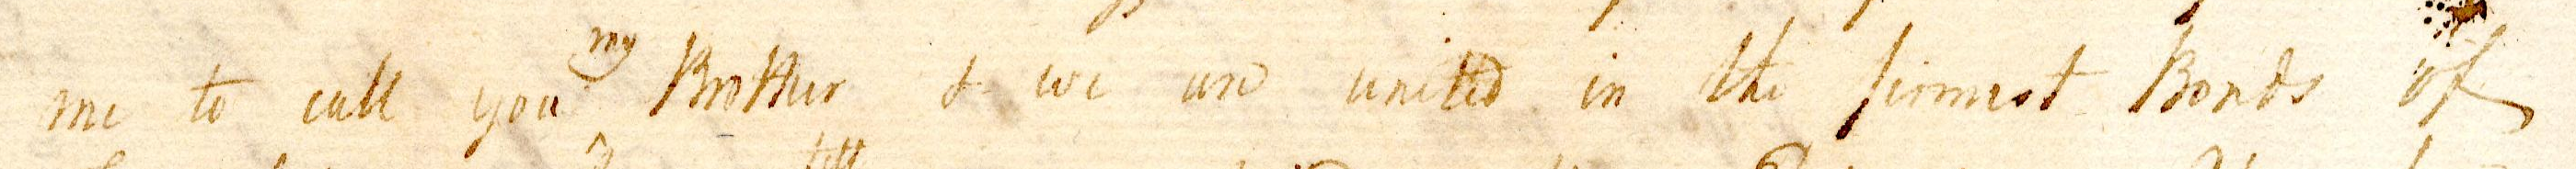me to call you ^ Brother & we are united in the firmest Bonds of
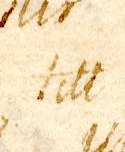tell
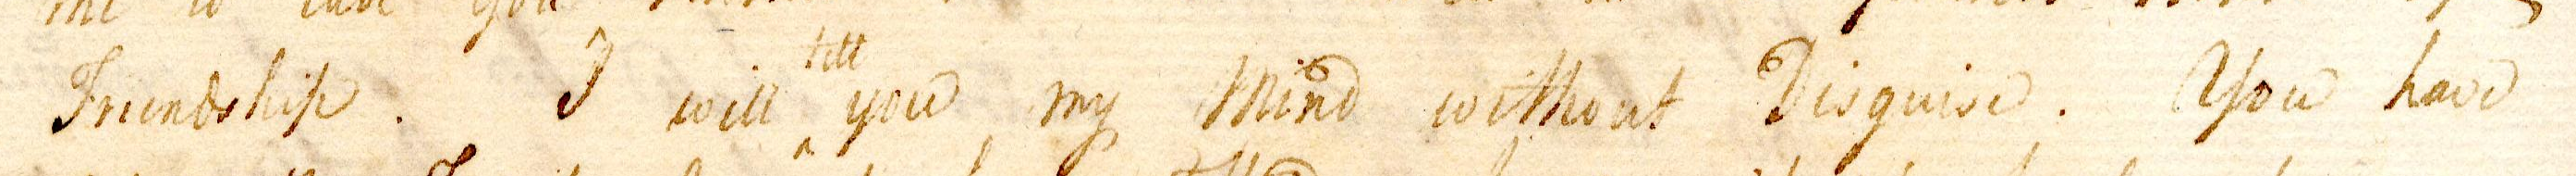Friendship. I will ^ you my Mind without Disguise. You have
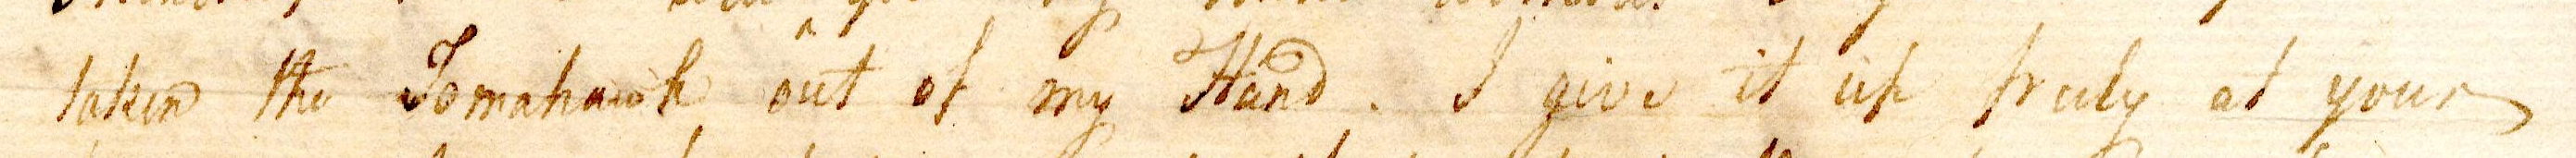taken the Tomahawk out of my Hand. I give it up freely at your
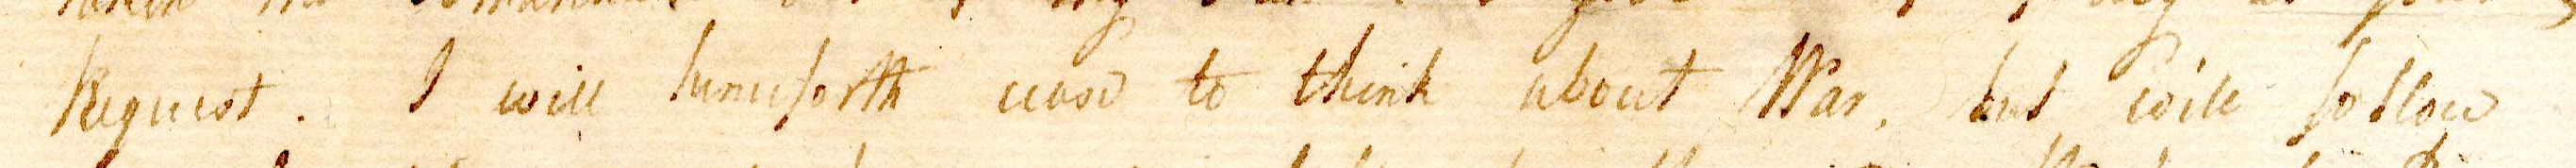Request. I will henceforth cease to think about War, but will follow
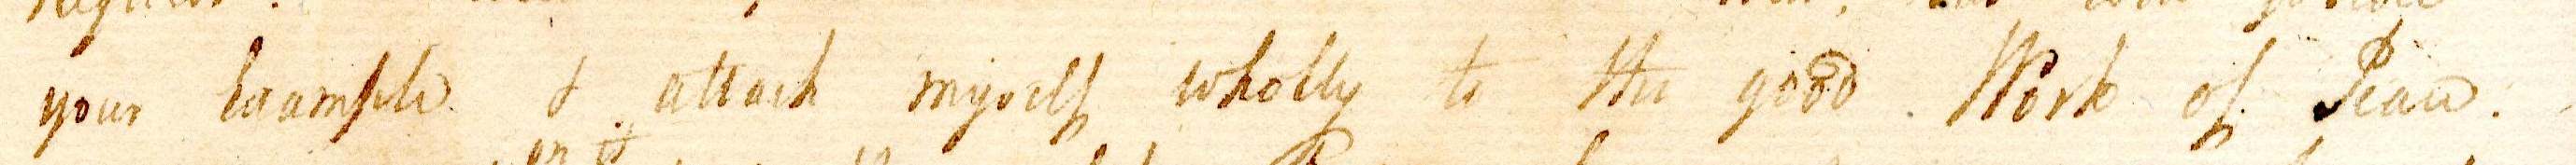your Example & attach myself wholly to the good Work of Peace.
